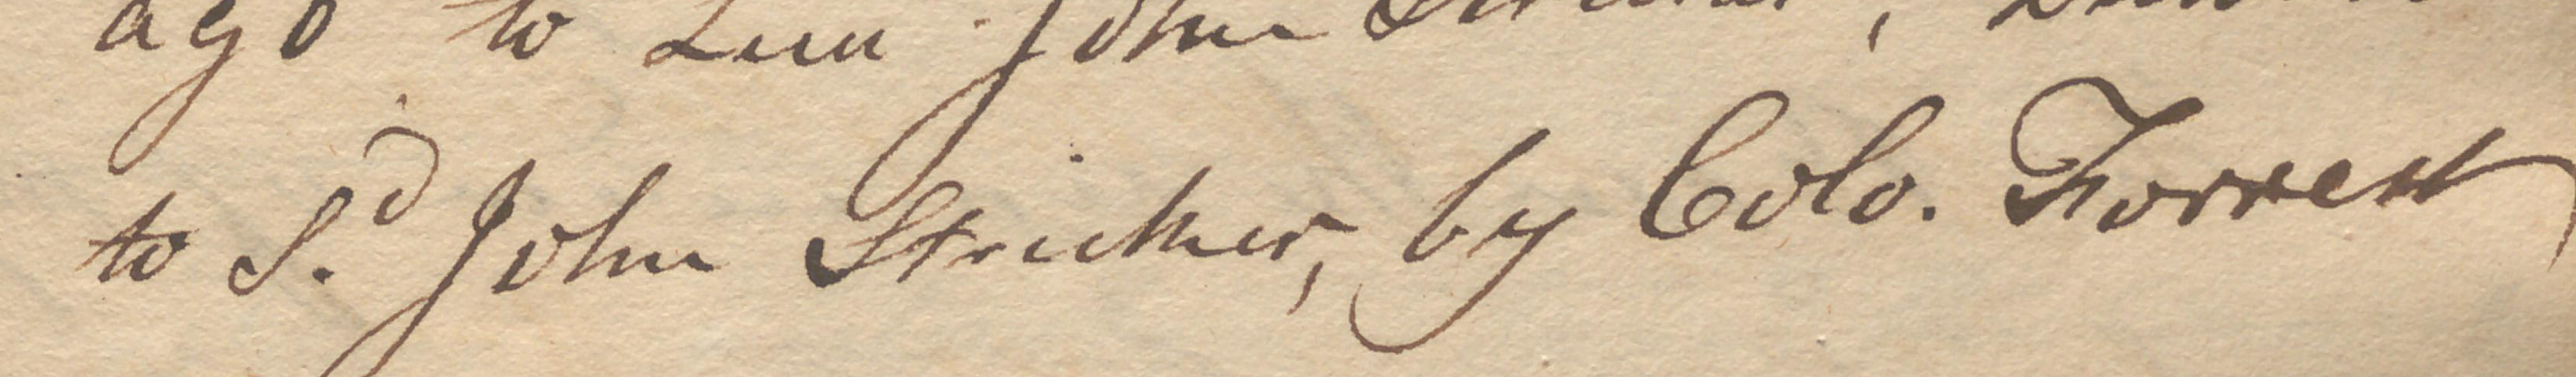to s^d. John Stricker, by Colo. Forrest
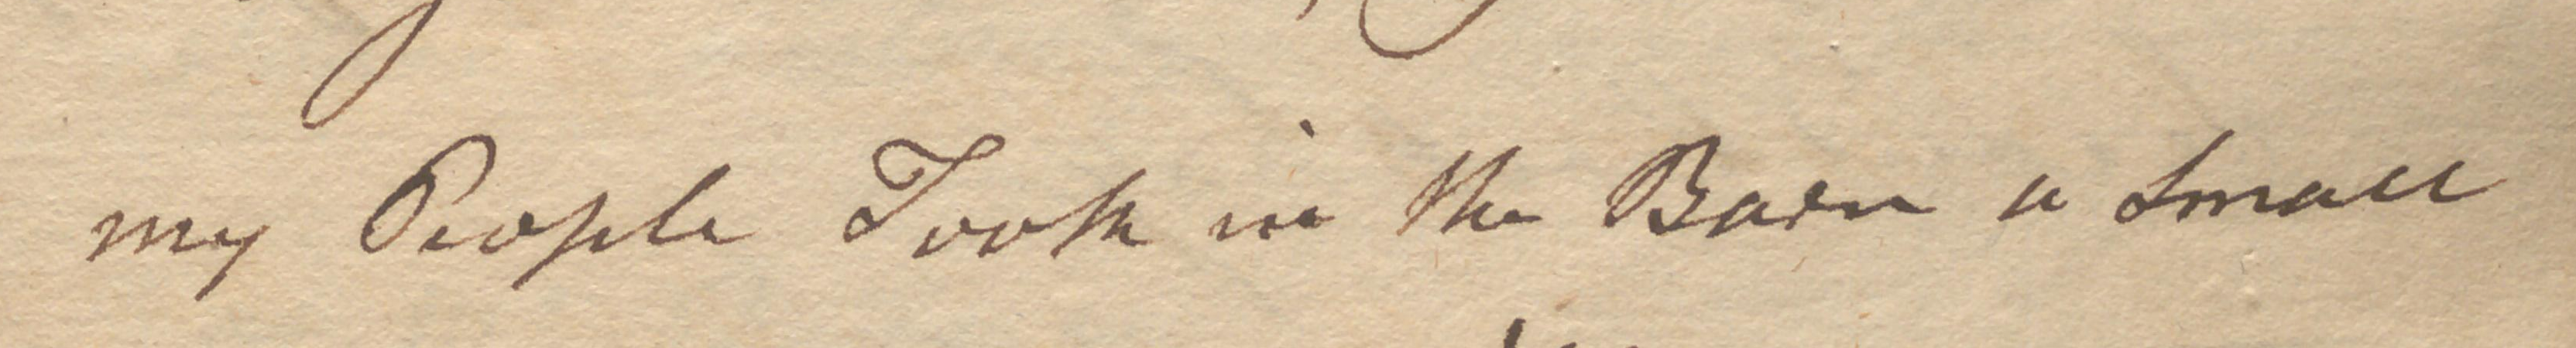my People Took in the Barn a small
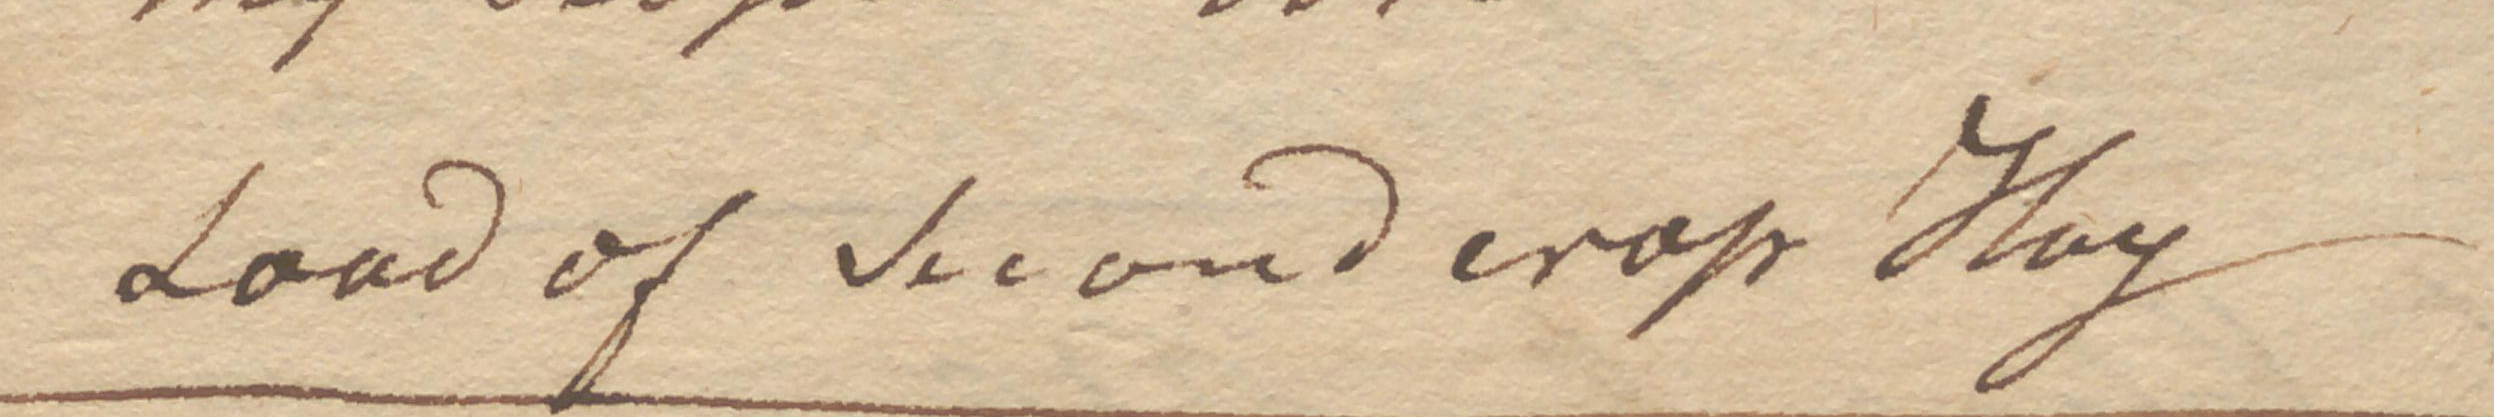Load of second crop Hay
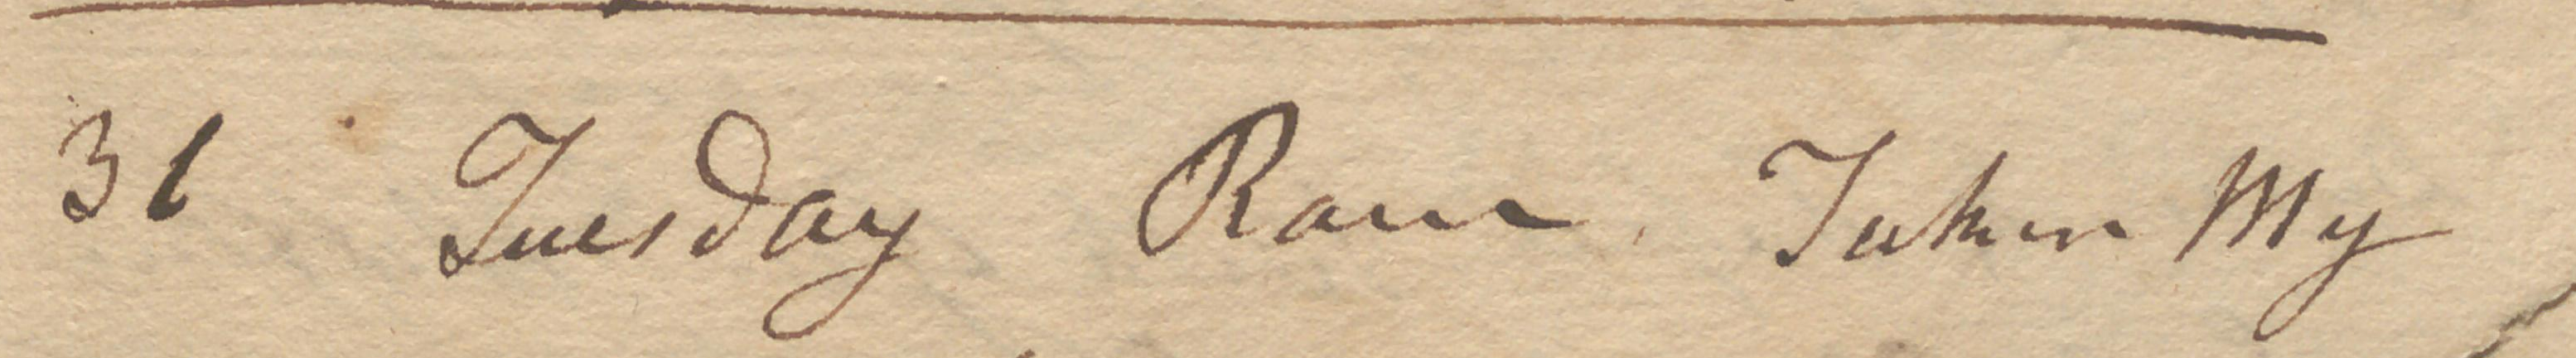31 Tuesday Rain. Taken My
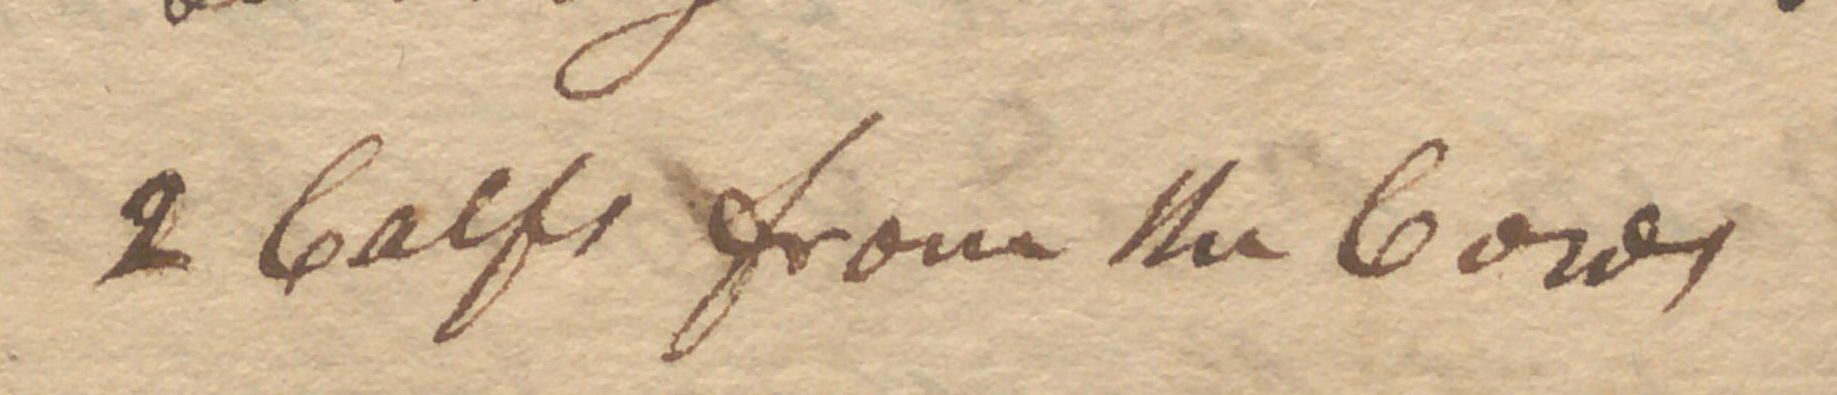2 Calfs from the Cows
